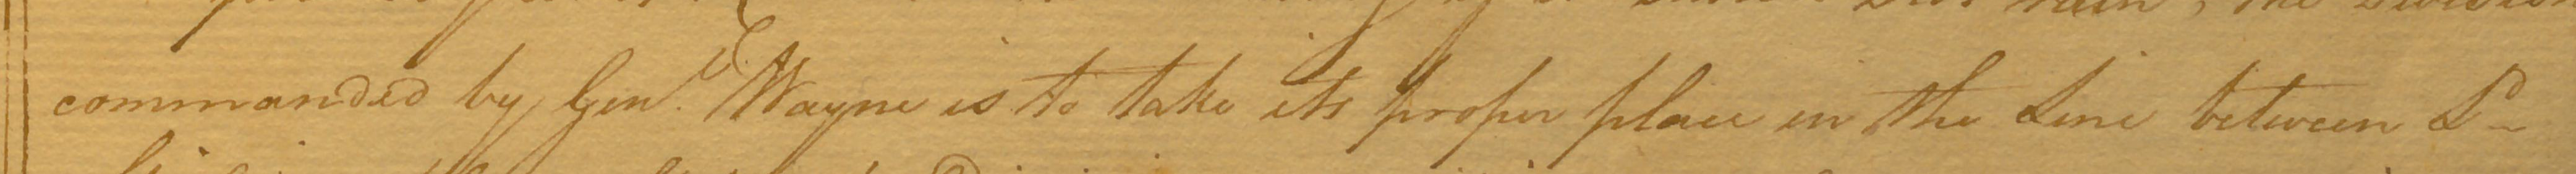commanded by Gen^l. Wayne is to take its proper place in the Line between L^d.
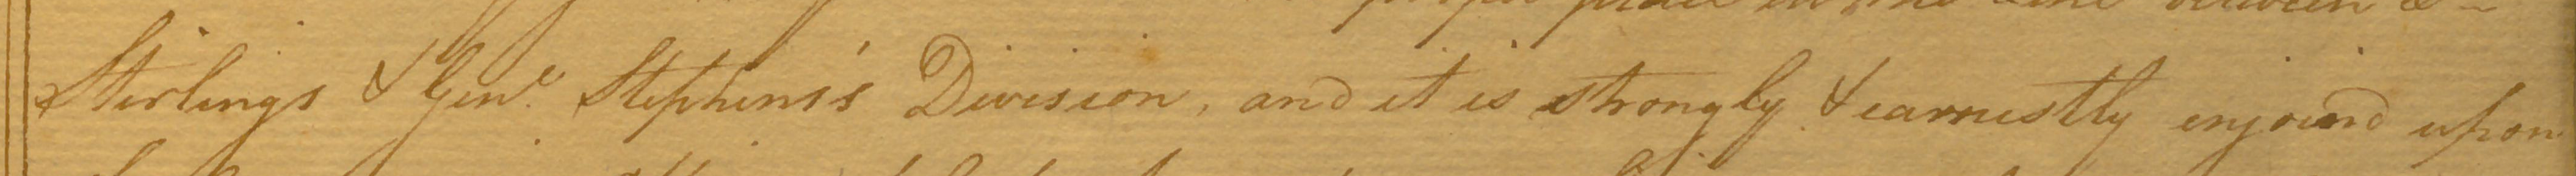Sterlings & Gen^l. Stephens's Division, and it is strongly & earnestly enjoin'd upon
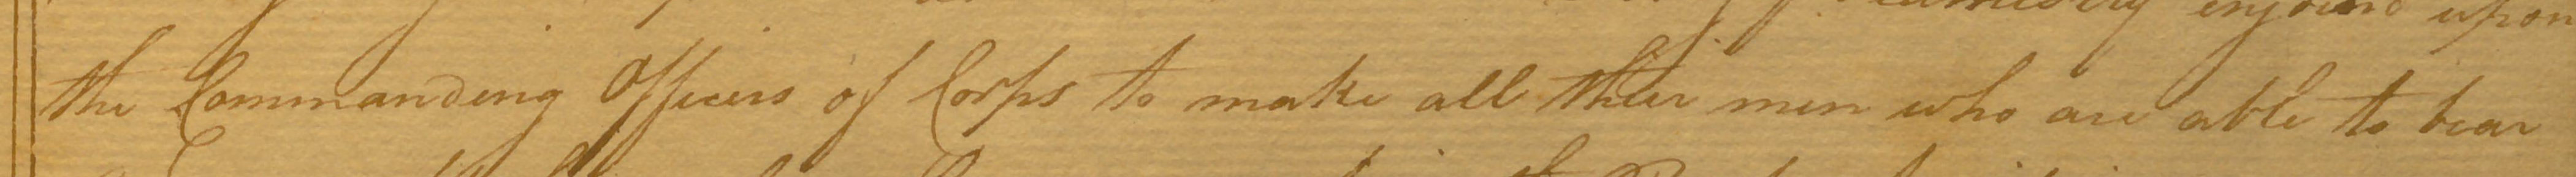the Commanding Officers of Corps to make all their men who are able to bear
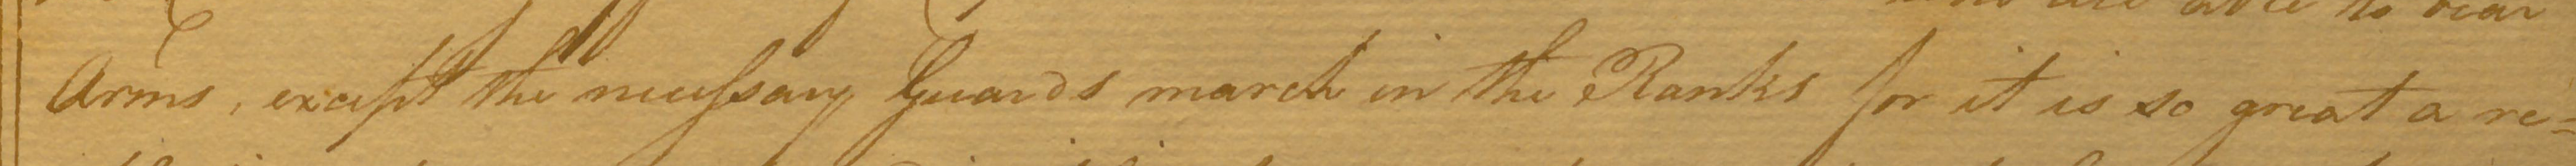Arms, except the necessary Guards march in the Ranks for it is so great a re-
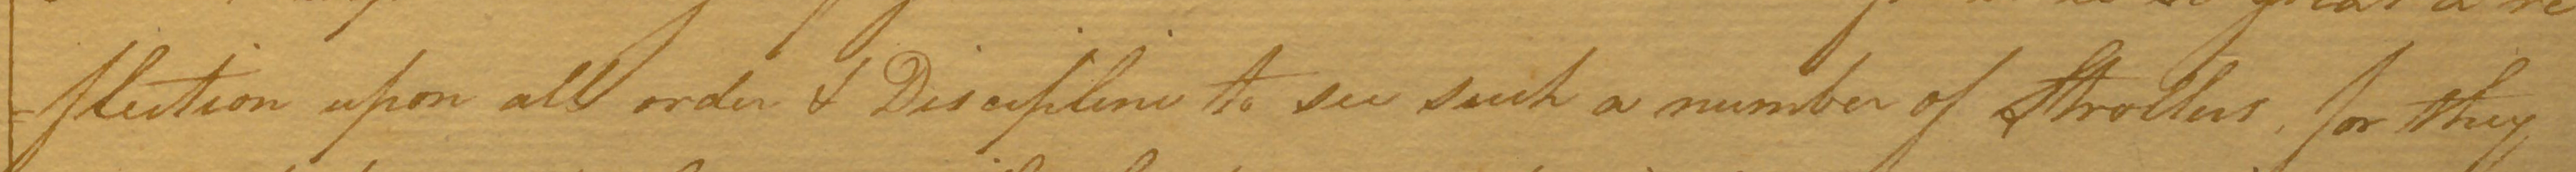flection upon all order & Discipline to see such a number of Strollers for they
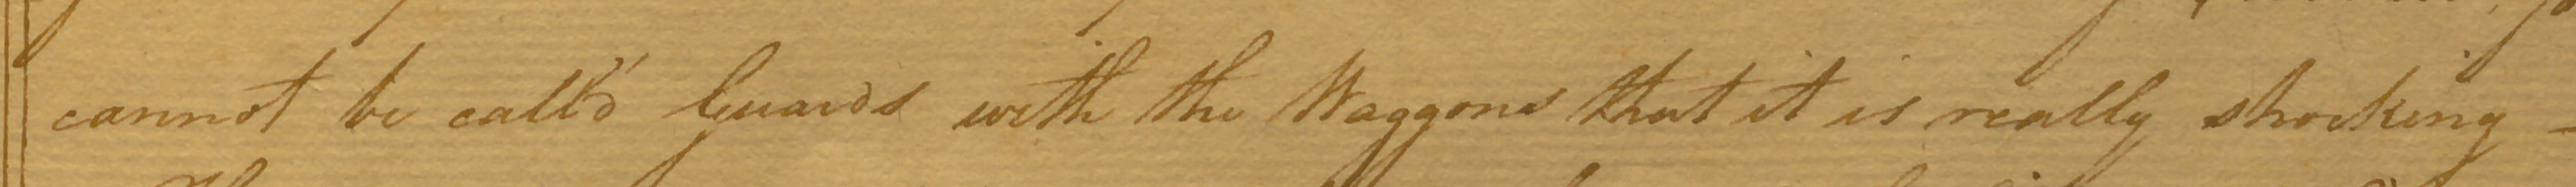cannot be call'd Guards with teh Waggons that it is really shocking-
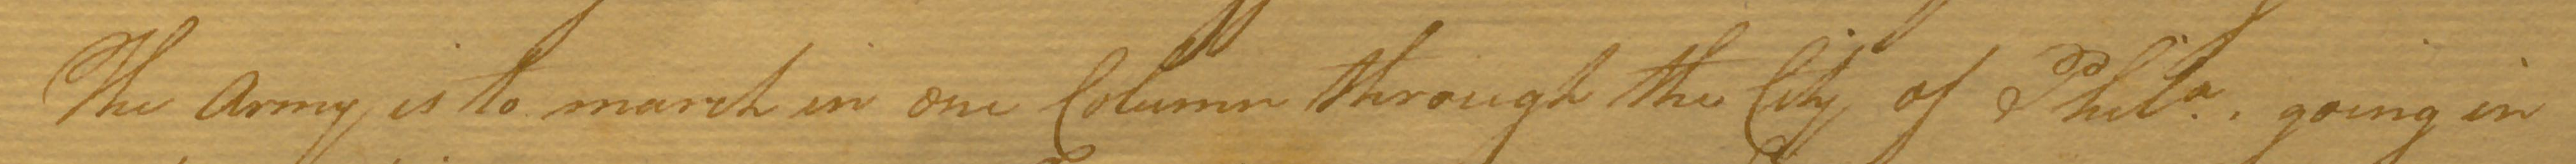The Army is to march in one Column through the City of Phil^a. going in
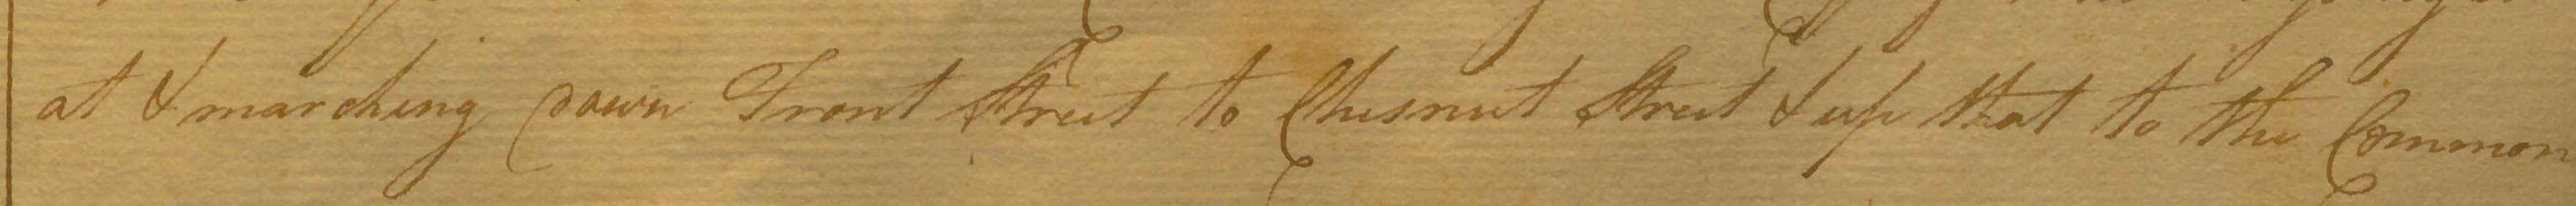at & marching down Front Street to Chestnut Street & up that to the Common
